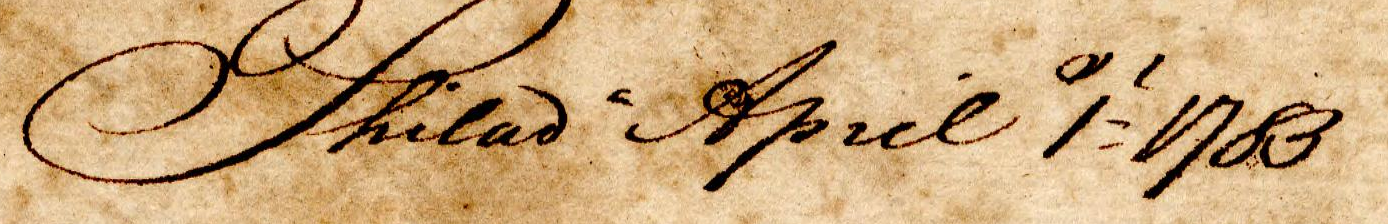Philad^a April 1^st. 1783
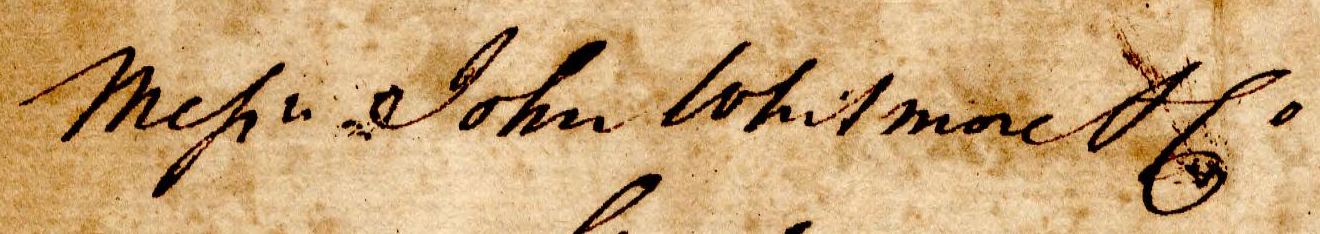Mess^r. John Whitmore & C^o
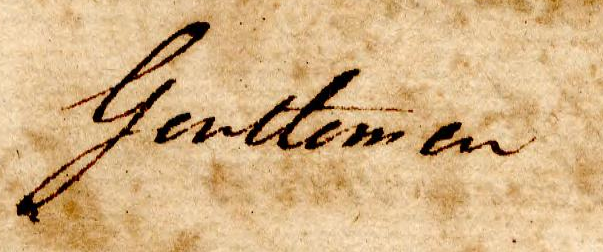Gentlemen
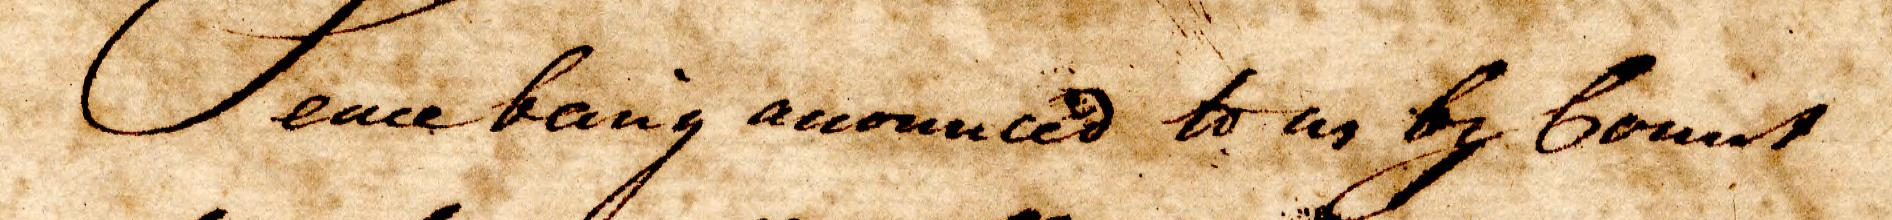Peace being announced to us by Count
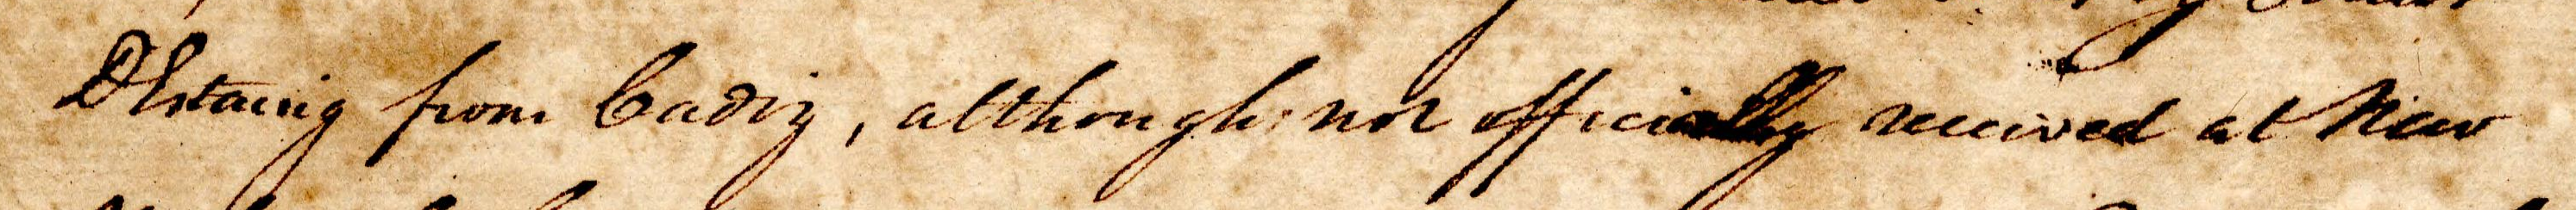D'Estaing from Cadiz, although not officially received at New
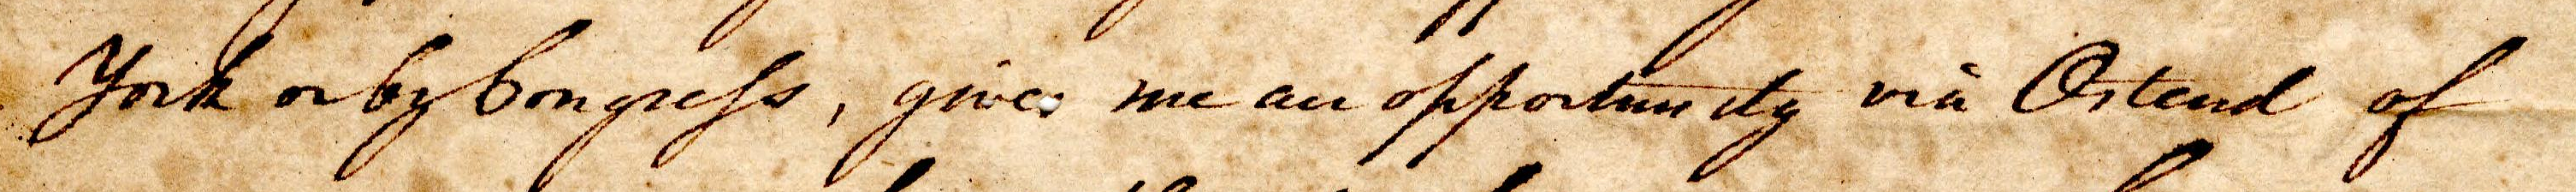York or by Congress, gives me an opportunity via Ostend of
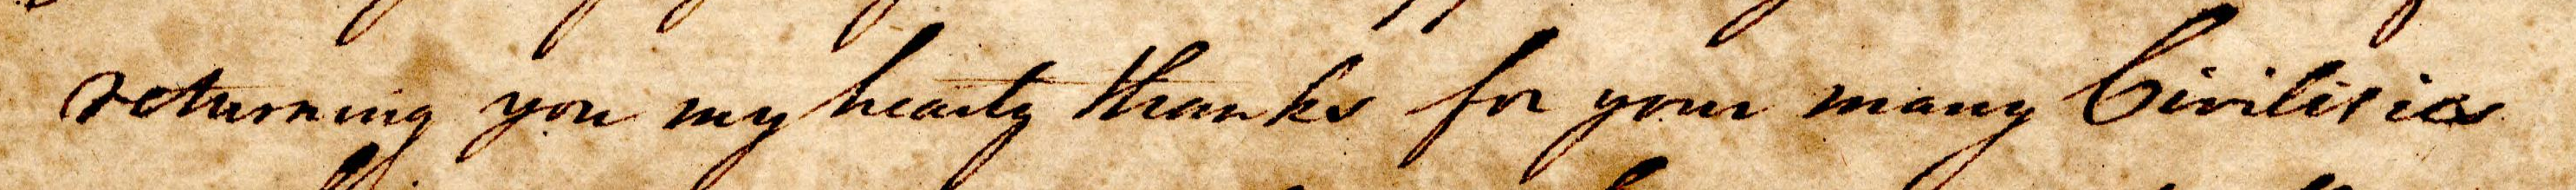returning you my hearty thanks for your many Civilities
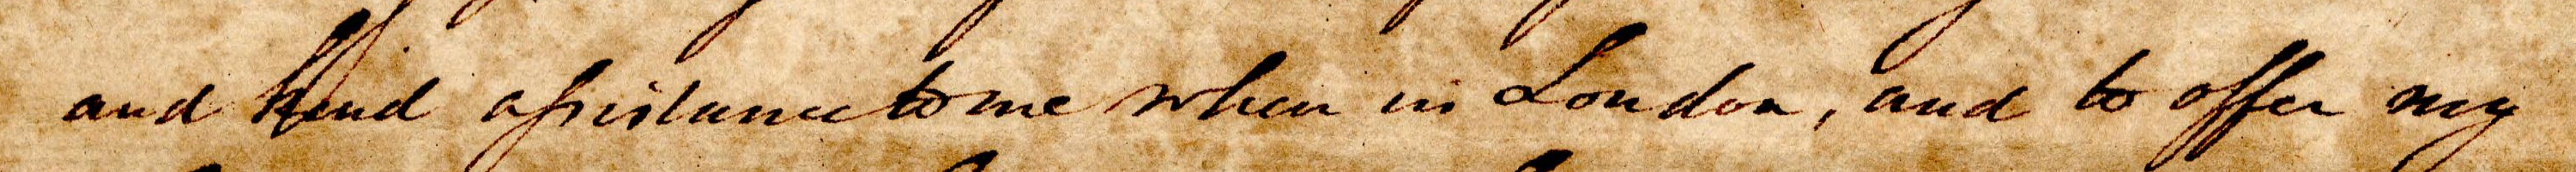and kind assistance to me when in London, and to offer my
